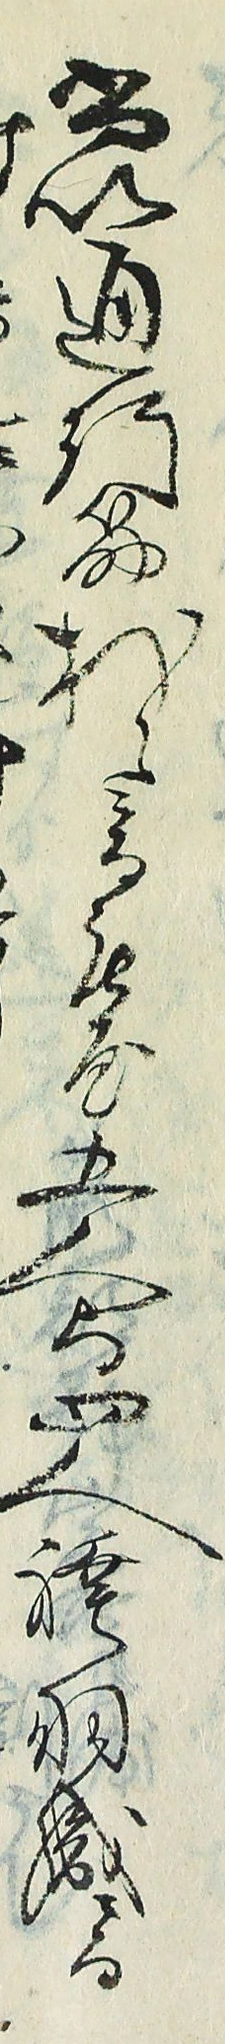尚以通行筋村々にて庄屋五人与四人袴羽織にて
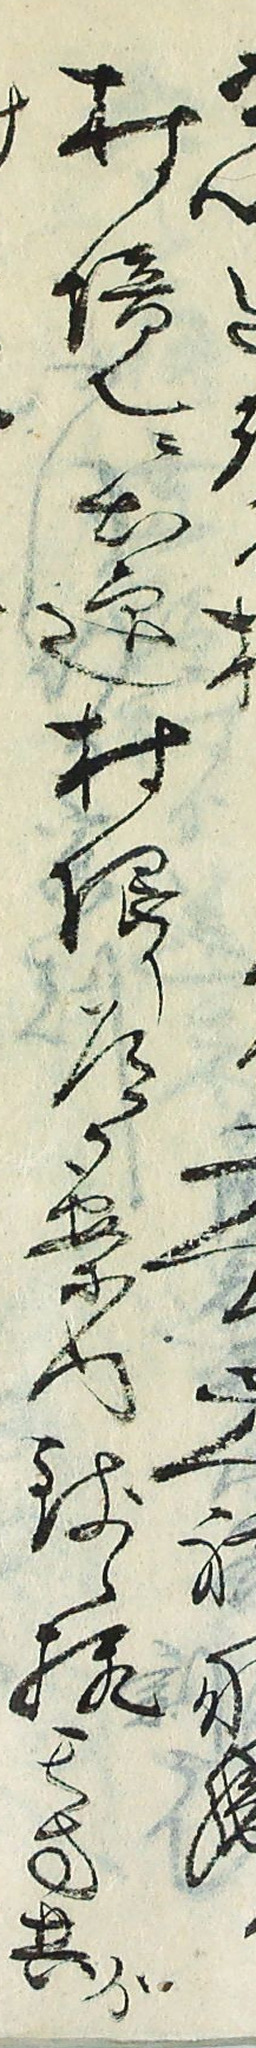村境に出迎村限り道御案内致候様其方共ゟ
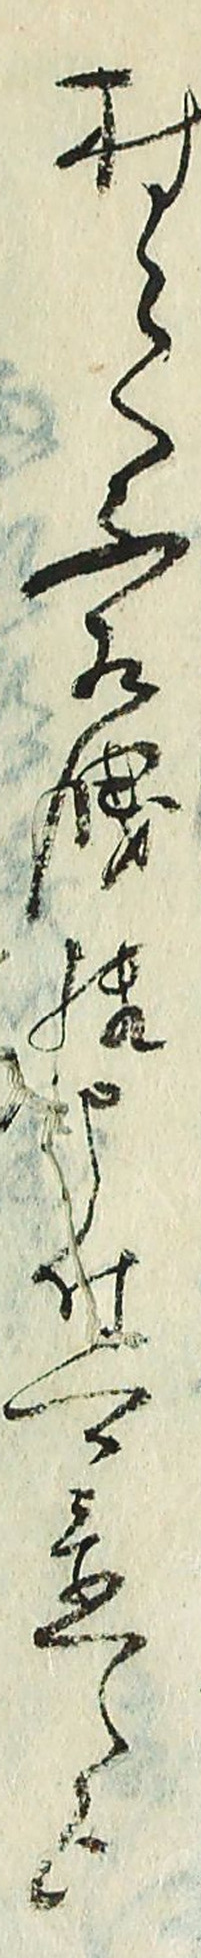村々へ不相洩様申付可置候以上
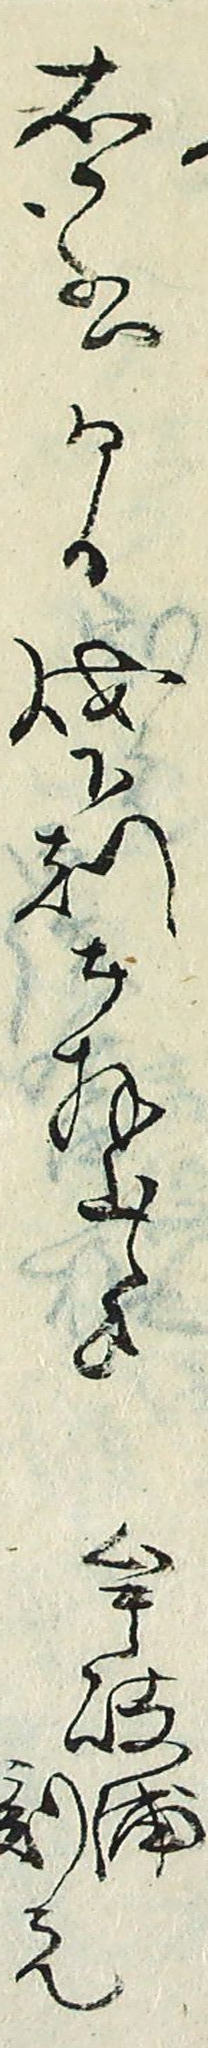右御書同日戌下刻奉拝上候以上牟岐村割元
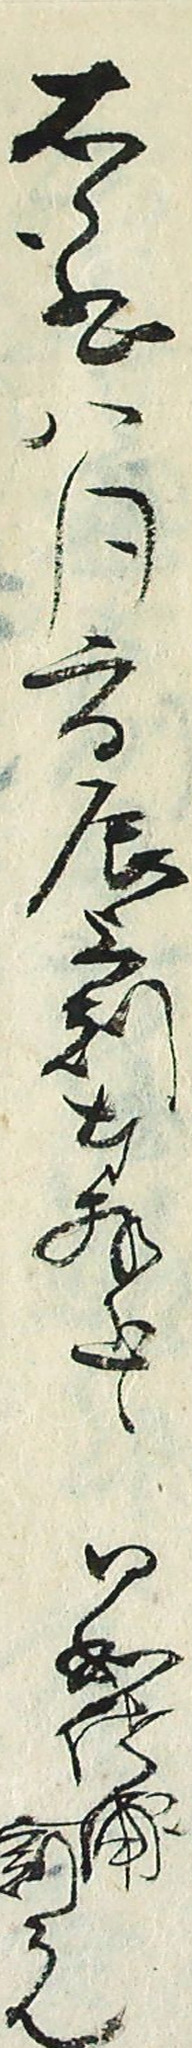右御書八月二日辰上刻奉拝上候日和佐浦割元
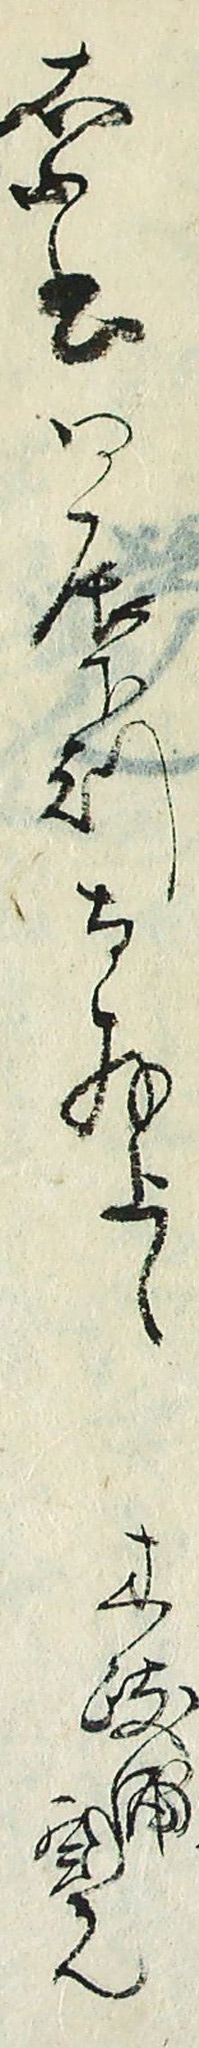右御書同辰下刻奉拝上候木岐浦割元
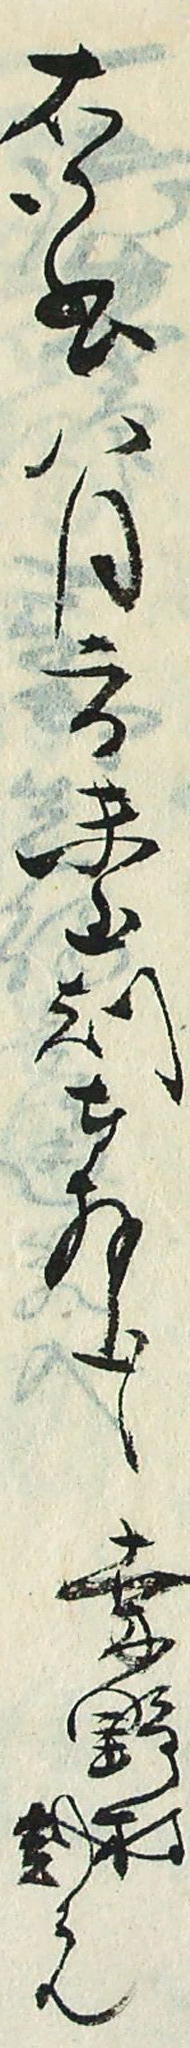右御書八月二日未上刻奉拝上候桑野村割元
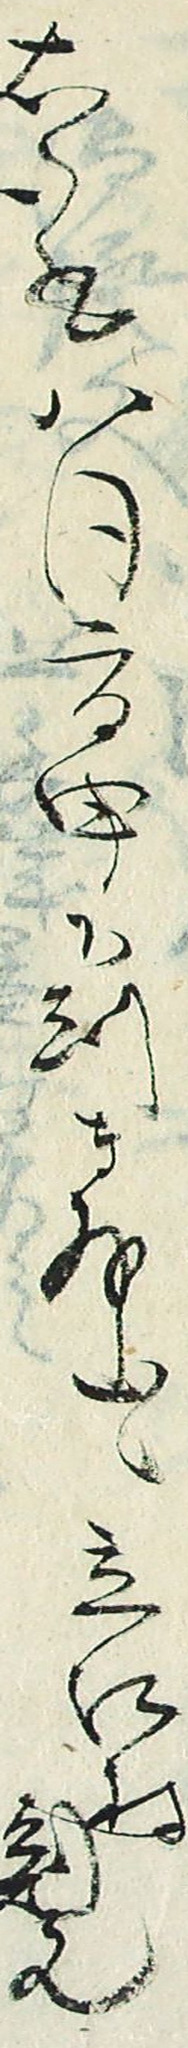右御書八月二日申下刻奉拝上候立江村割元

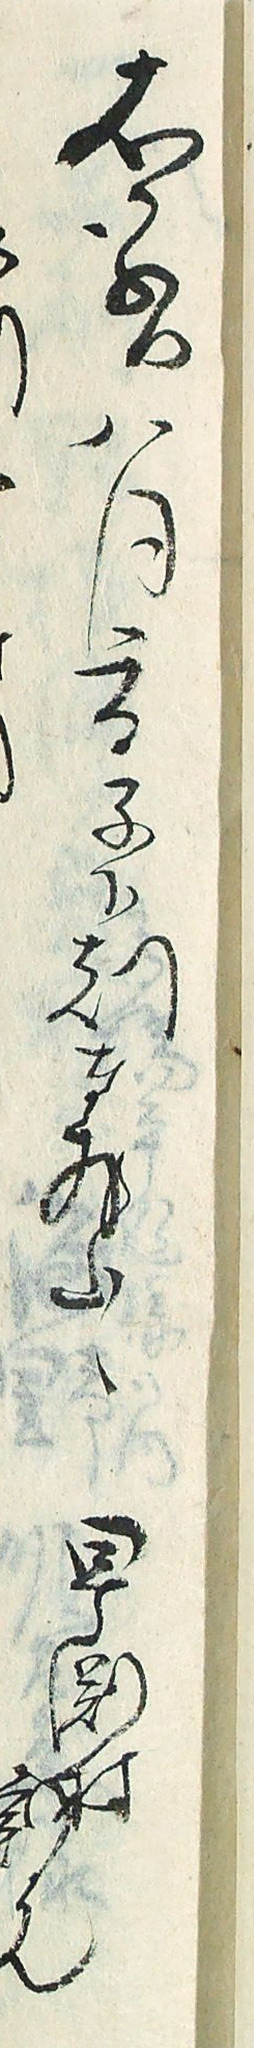右御書八月二日子下刻奉拝上候早淵村割元
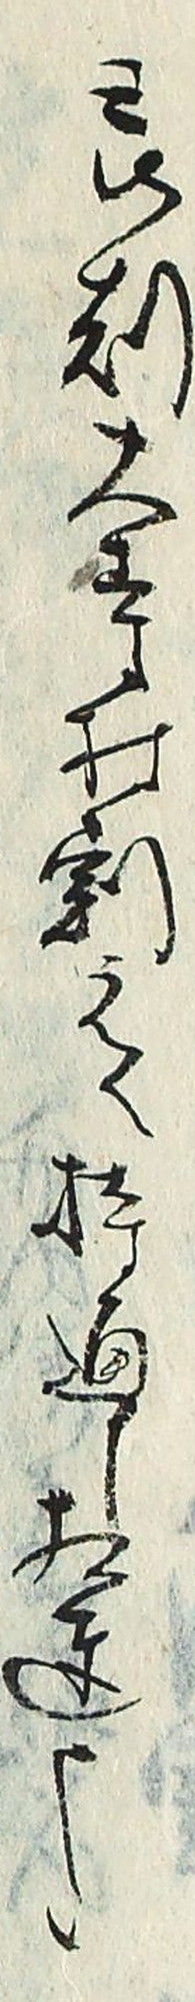即刻大寺村割元へ持通し相達申候
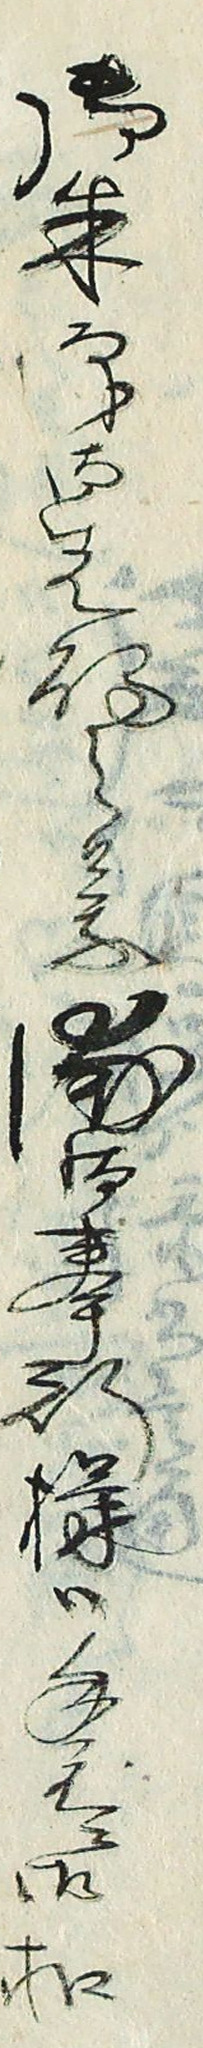御朱印御先触之義浦御奉行様御手元に御扣
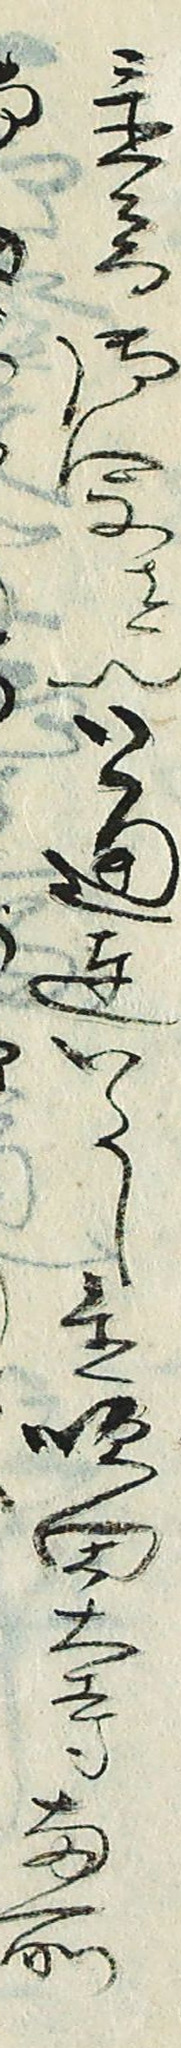置にて御写を以御通達いたし置吹田大寺両所
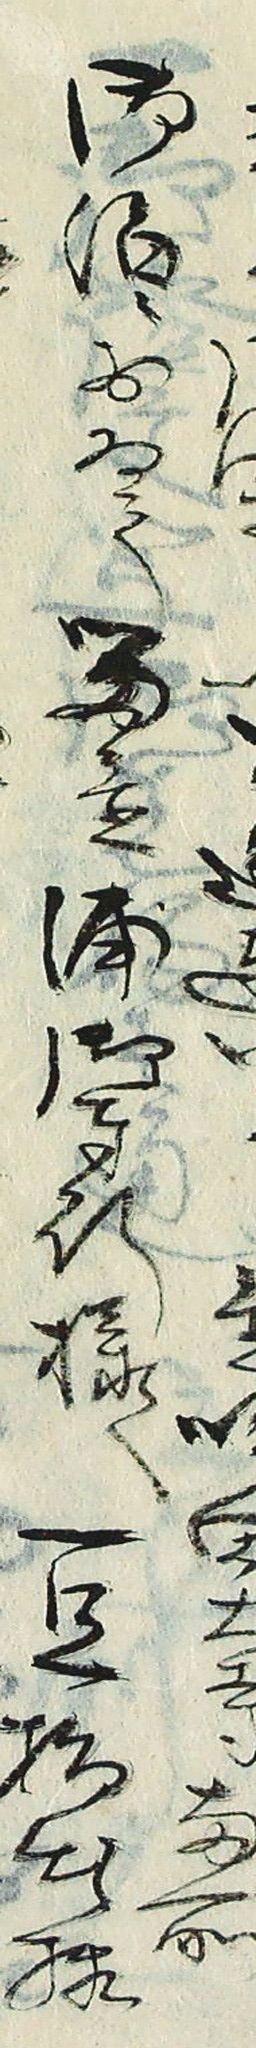御泊におゐて留置浦御奉行様へ一旦指出候様
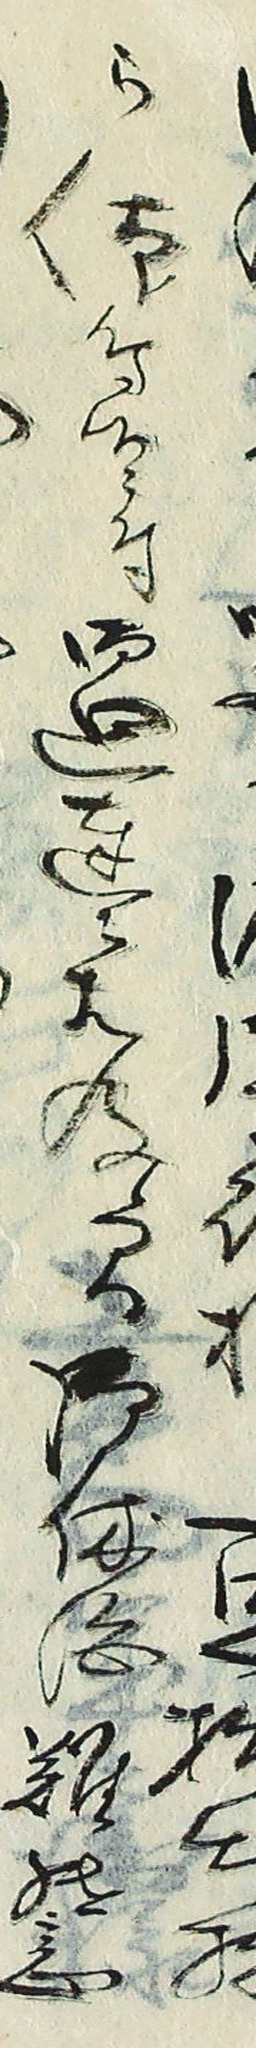被仰付候に付御廻達に相及候間御休泊難継急
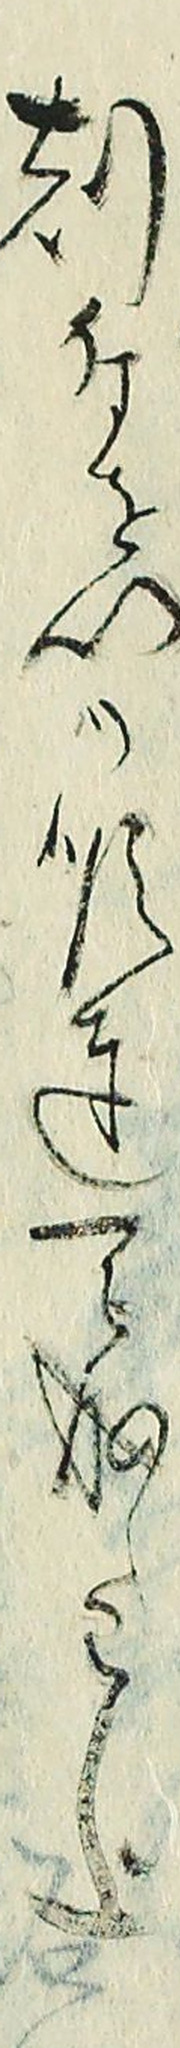刻付を以御順達可被成候以上
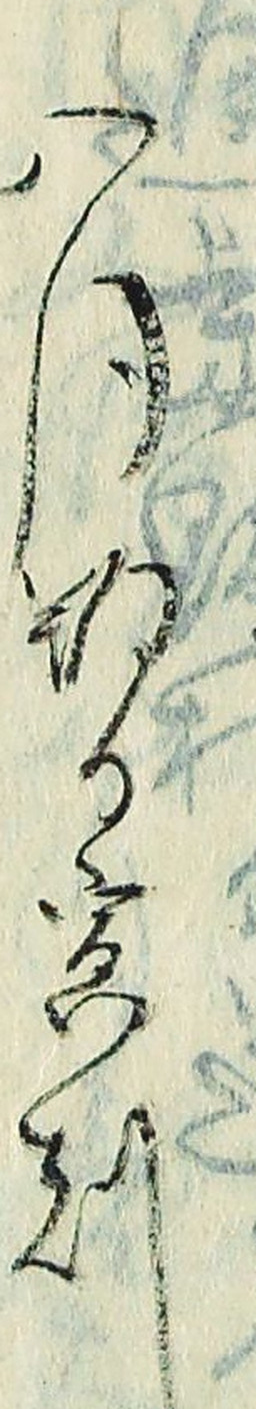八月朔日寅刻
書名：公辺御役人為御廻浦御立越諸御用一巻
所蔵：鳴門教育大学 Naruto University of Education
